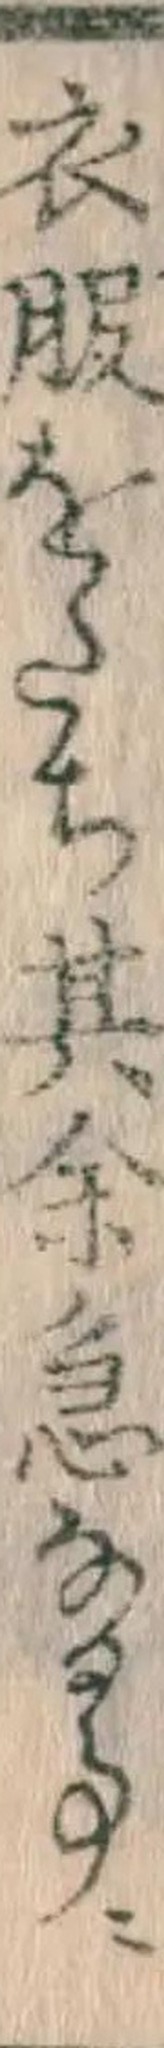衣服をたち其余急なる事に
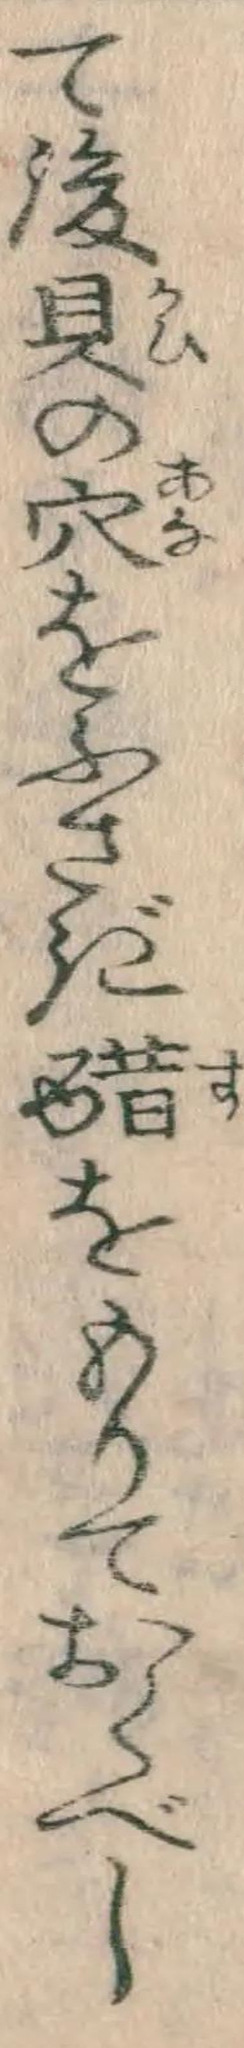て後貝の穴をふさぎ醋をもりておくべし
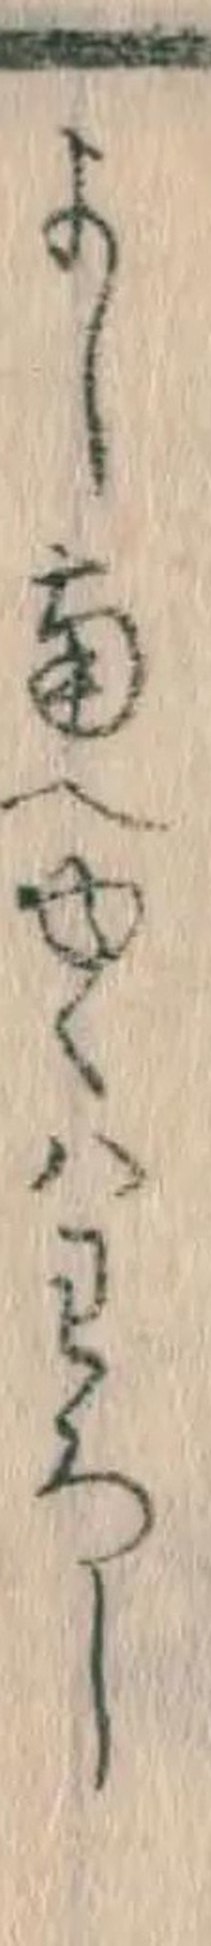よし南へゆくはわろし
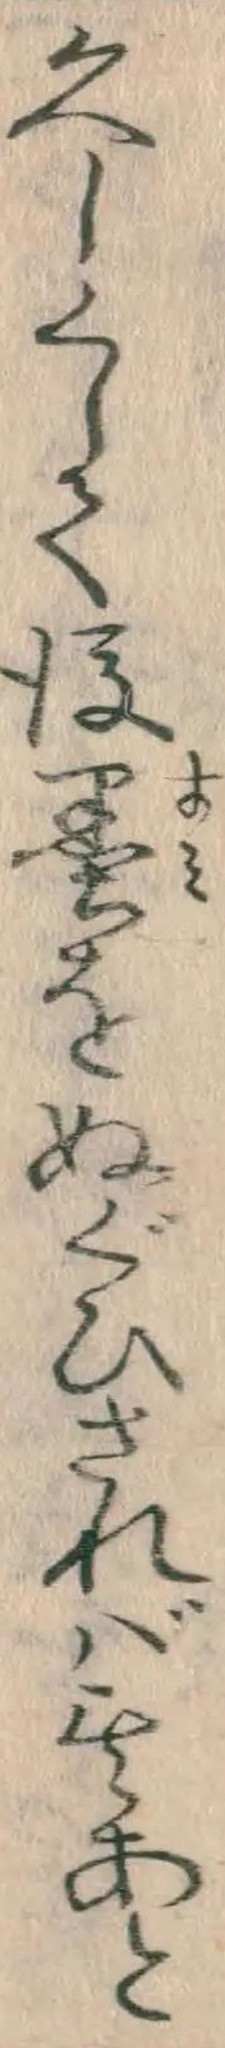久しくして後墨をぬぐひされば其あと
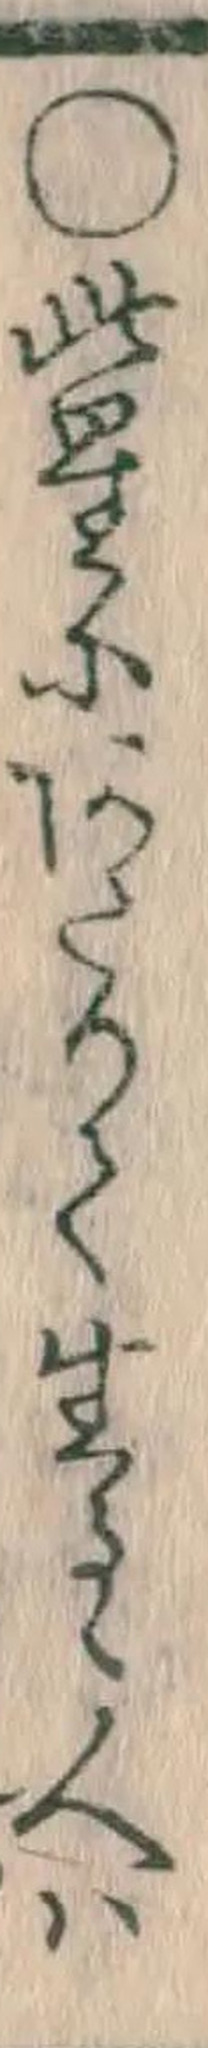○此星にあたりて生るゝ人は
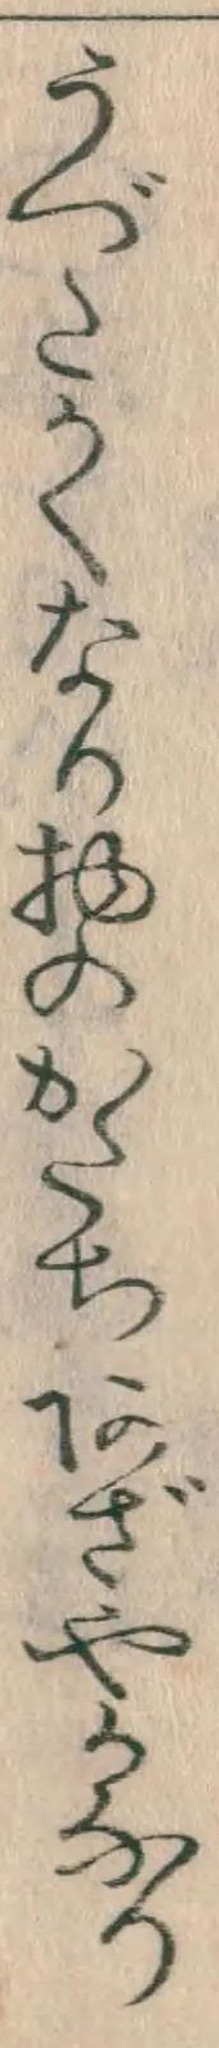うづたかくなり物のかたちあざやかなり
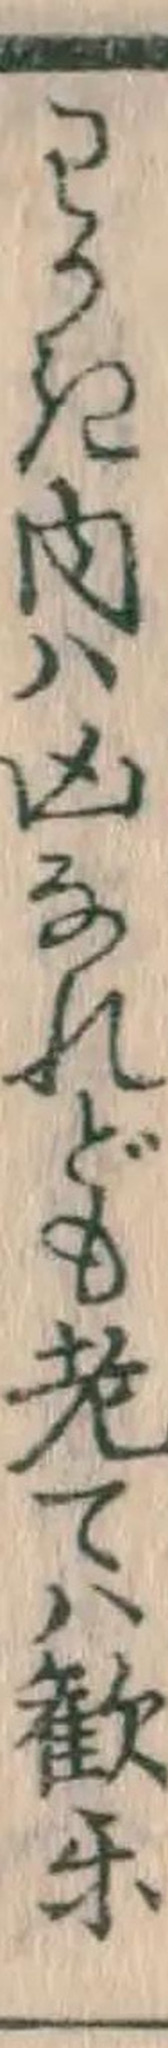わかき内は凶なれども老ては歓楽
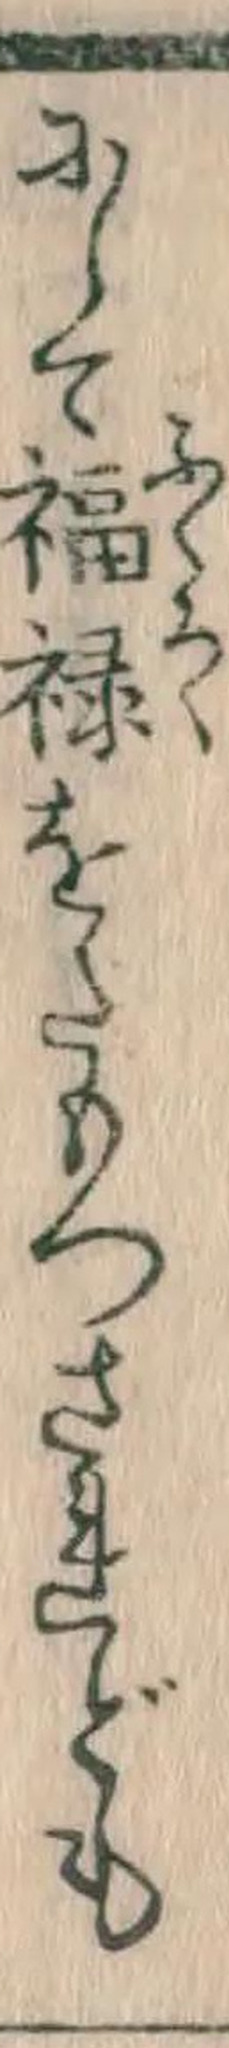にして福禄をたもつされども
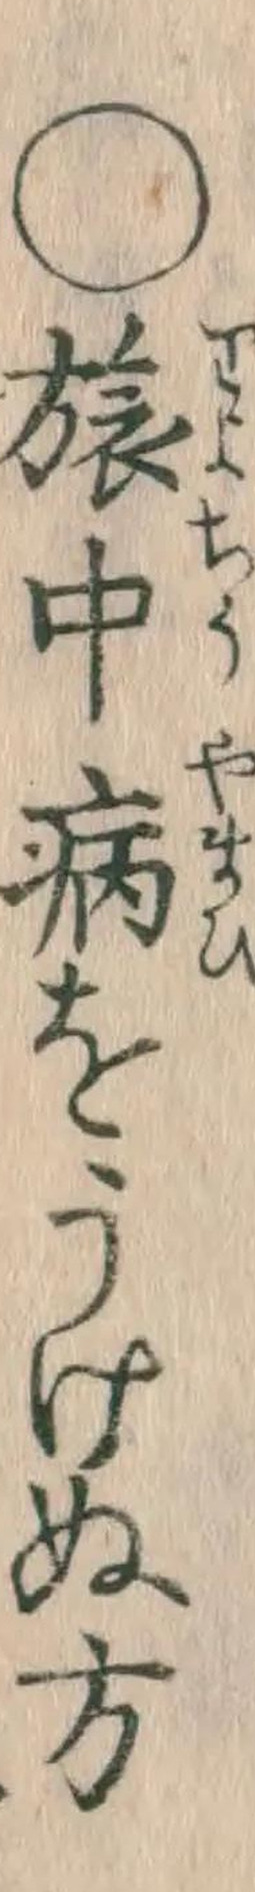○旅中病をうけぬ方
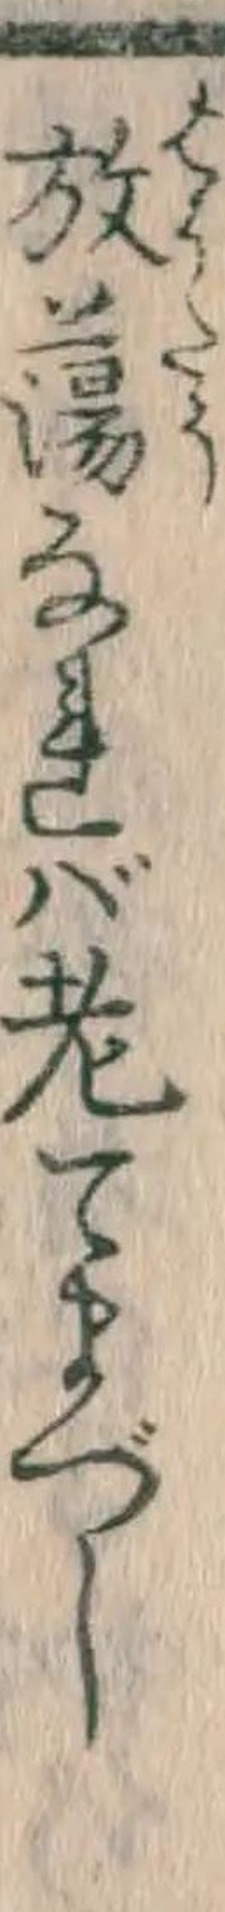放蕩なれば老てまづし
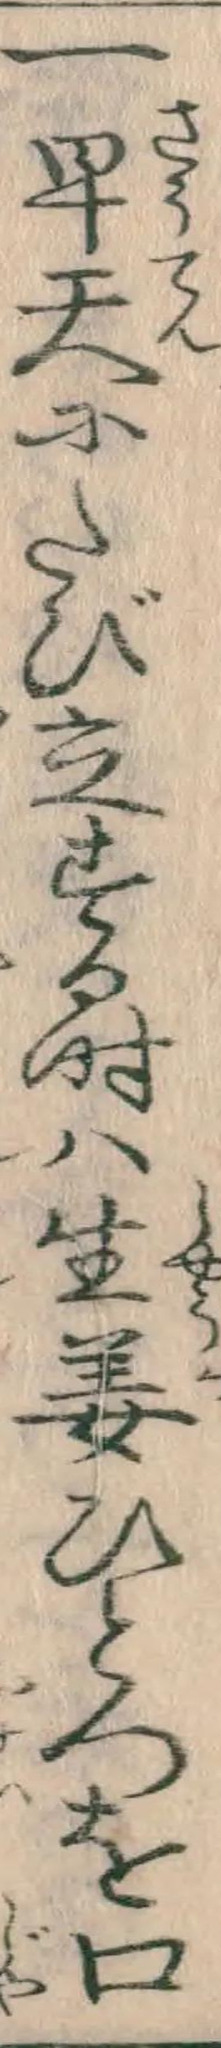一早天にたび立する時は生姜ひとつを口
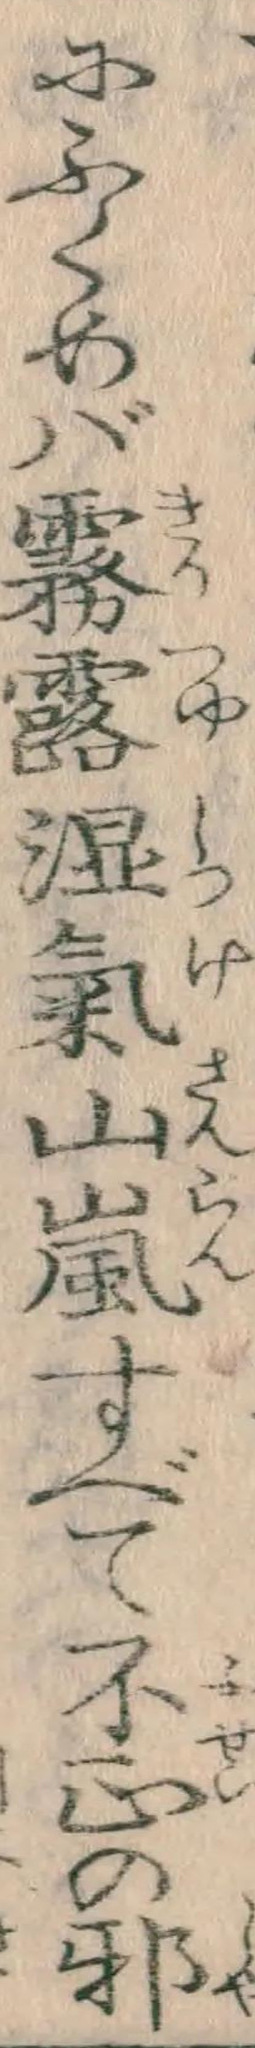にふくめば霧露湿気山嵐すべて不正の邪
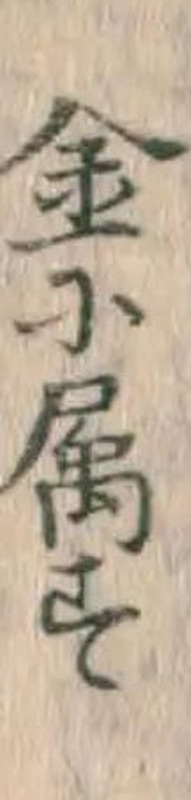胃金に属す
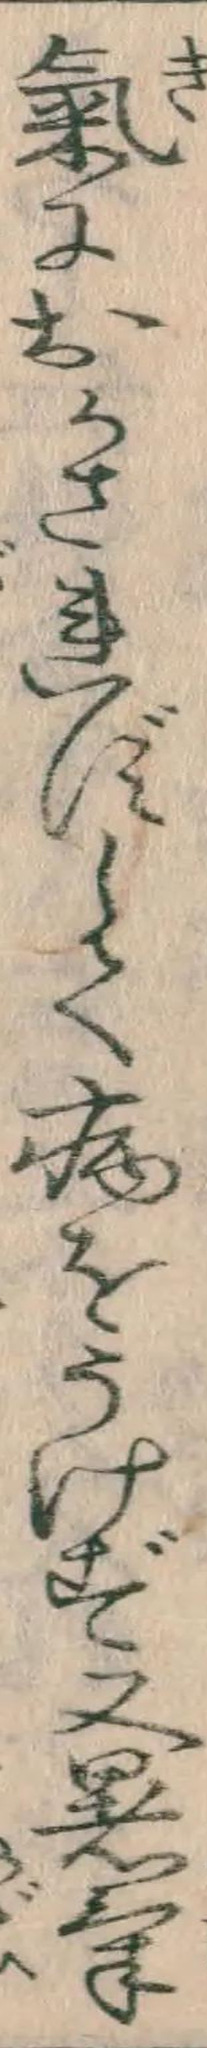気におかされずして病をうけず又暑気
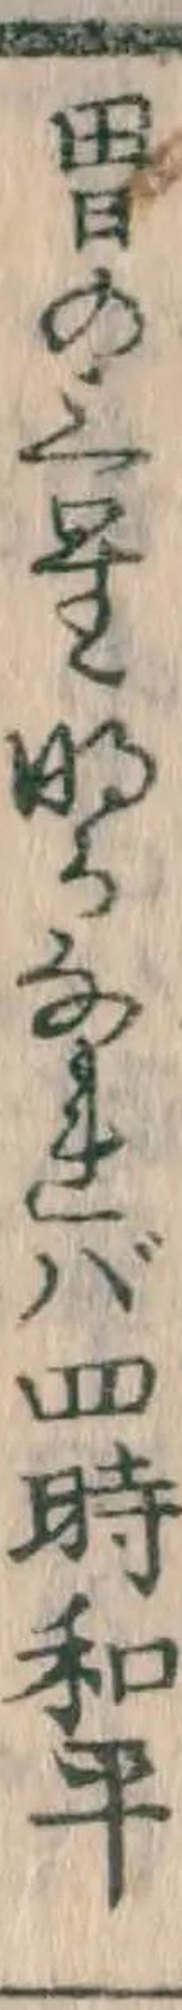胃の三星明かなれば四時和平
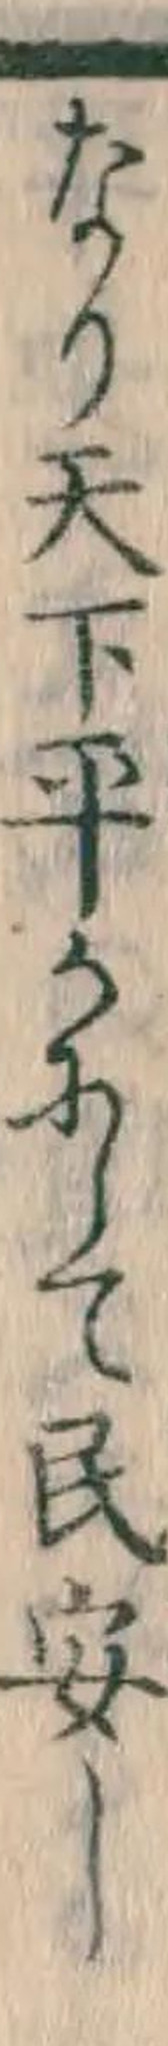なり天下平かにして民安し
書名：広益秘事大全 3巻. [2]
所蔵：国立国会図書館 National Diet Library, JAPAN
